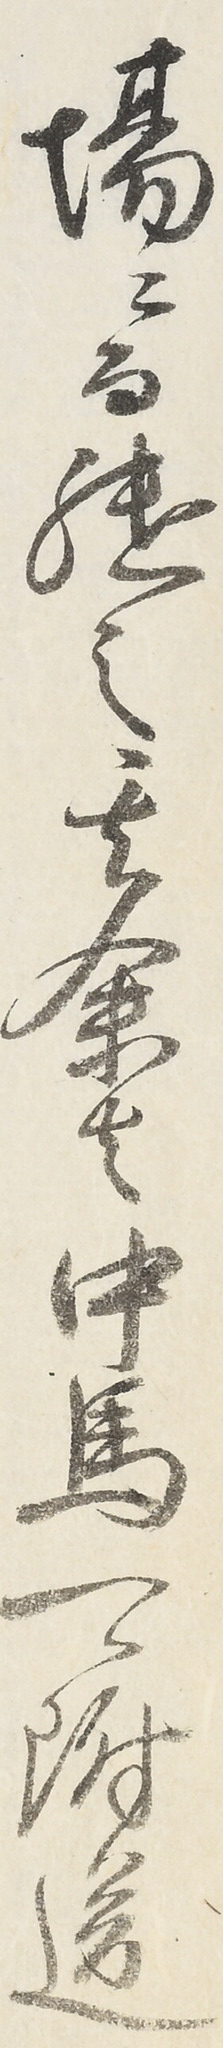場ニ而継之其余は中馬可附送
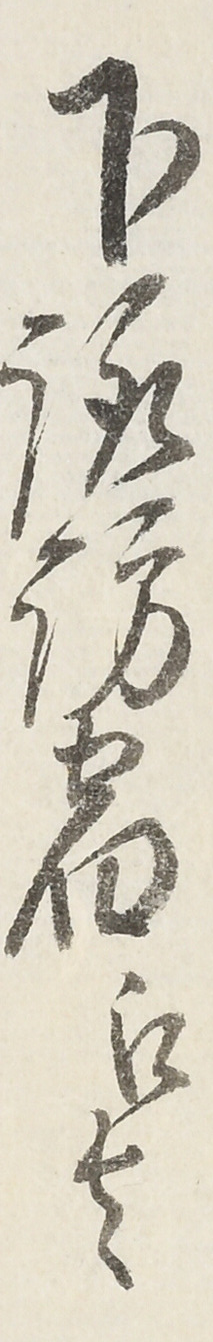下諏訪宿江は
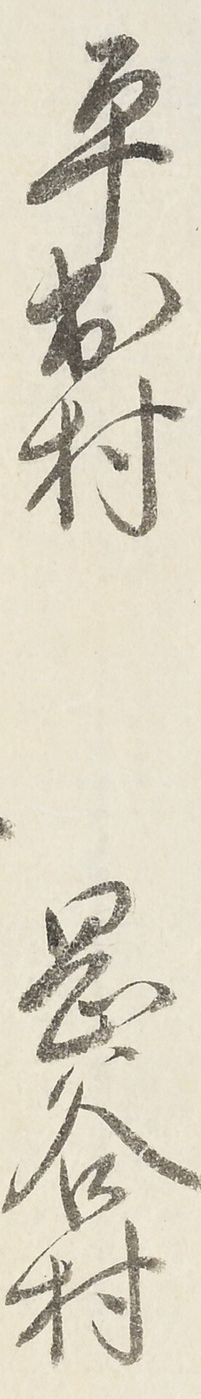平出村岡谷村
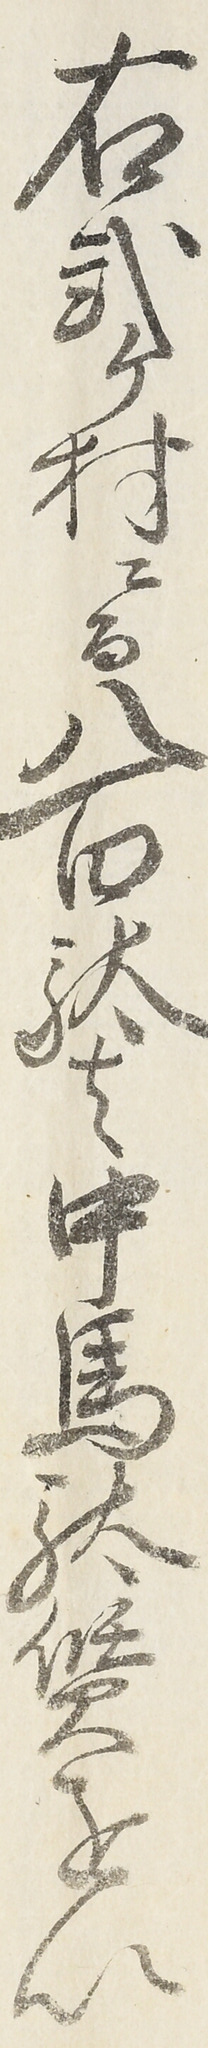右弐ヶ村ニ而八百駄は中馬駄賃を以
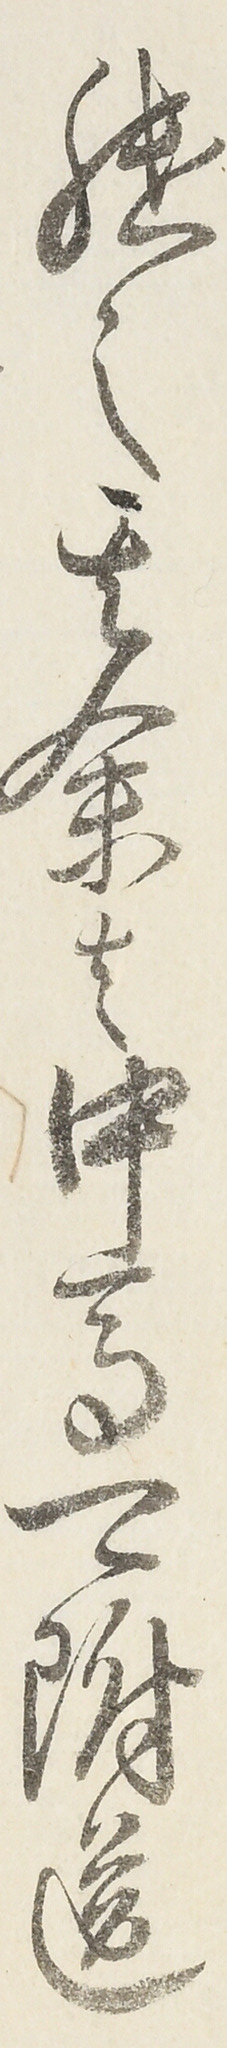継之其余は中馬可附送
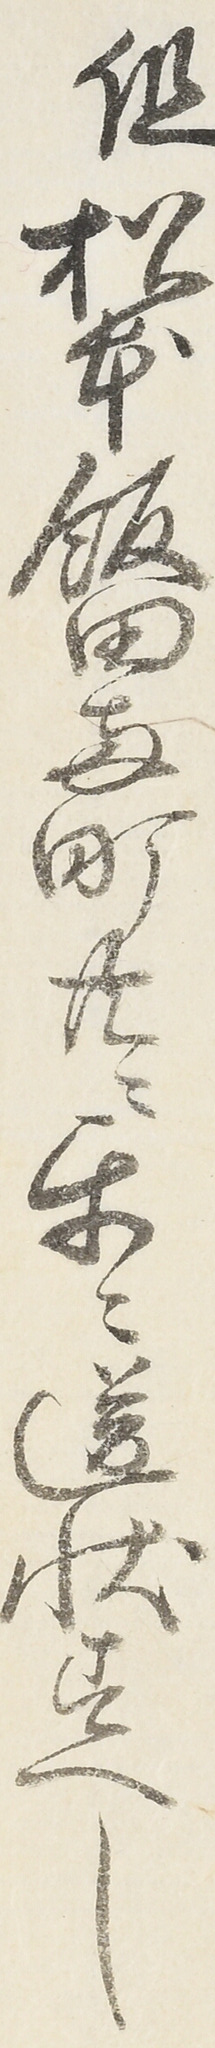但松本飯田両町共ニ互ニ送状すへし
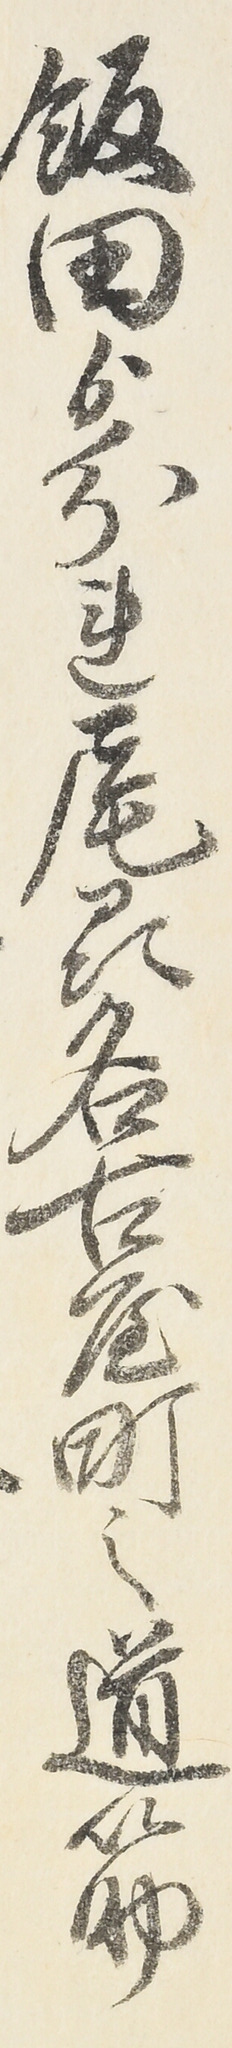飯田ゟ分れ尾州名古屋之道筋
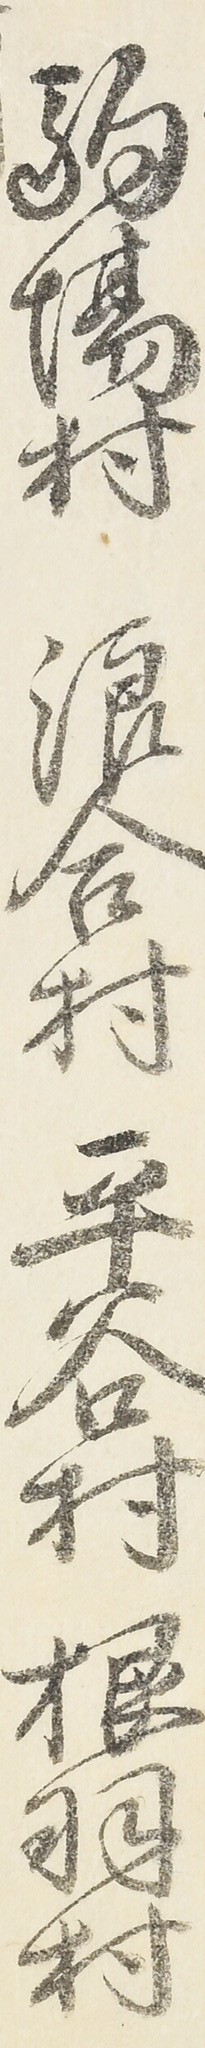駒場村浪合村平谷村根羽村
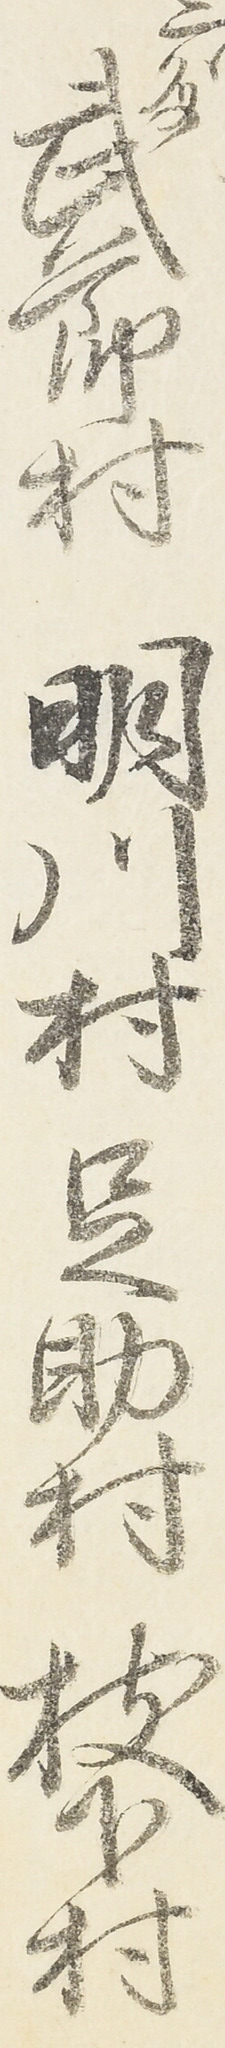武節村明川村足助村枝下村
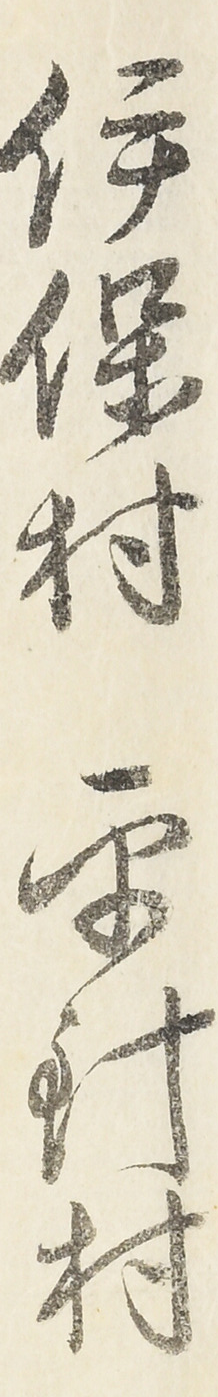伊保村平針村
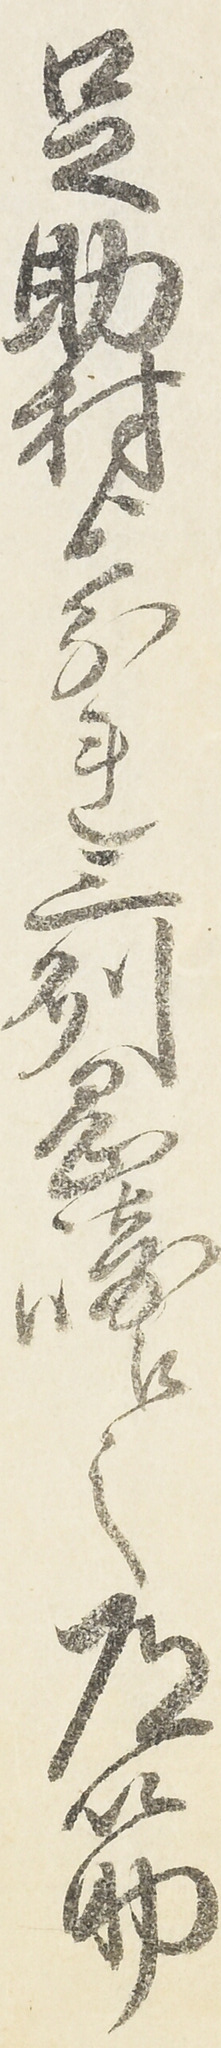足助村ゟ分れ三州岡崎江之道筋
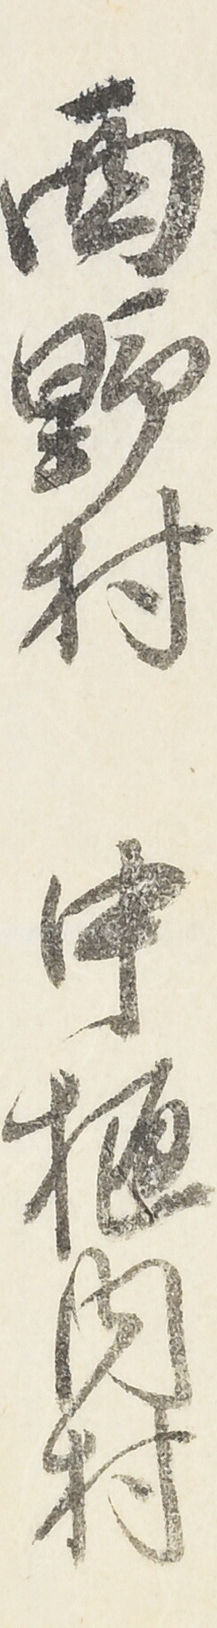西野村中樋内村
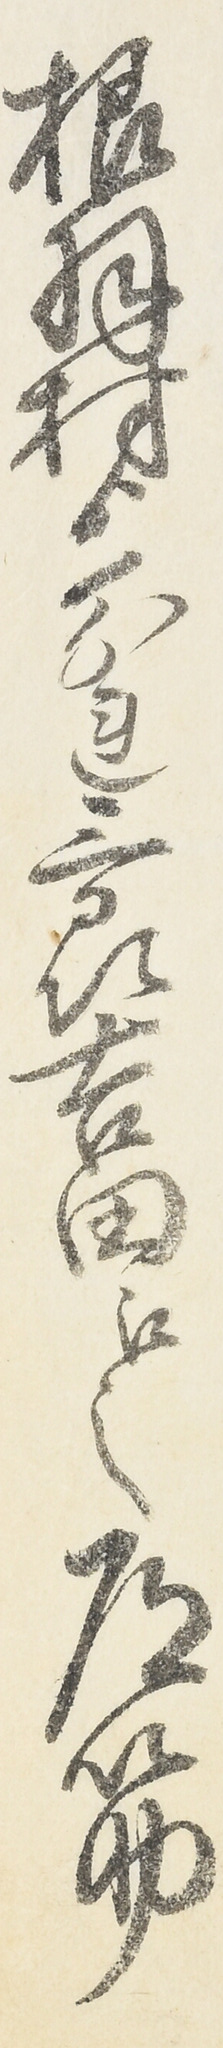根羽村ゟ分れ三州吉田江之道

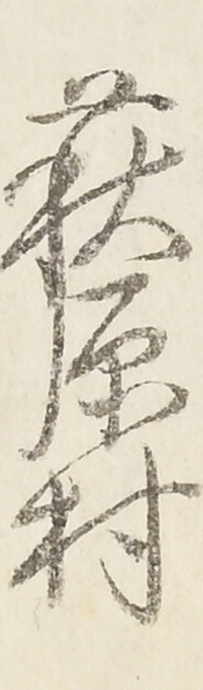萩原村
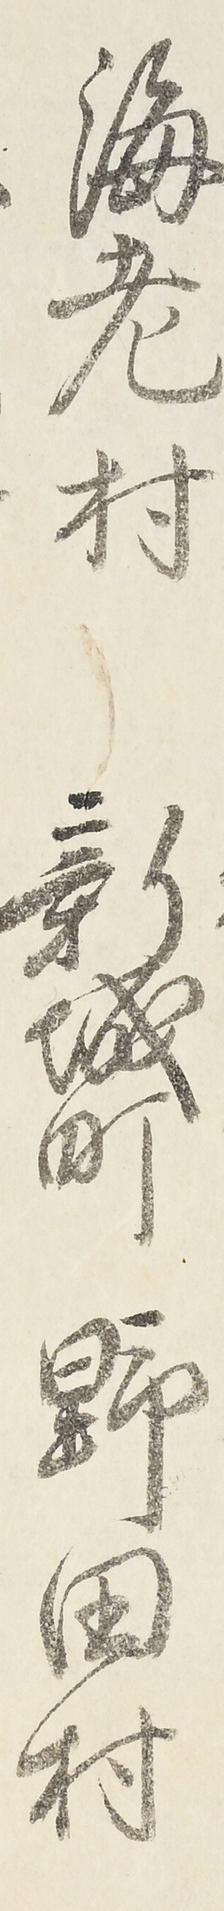海老村新城町野田村
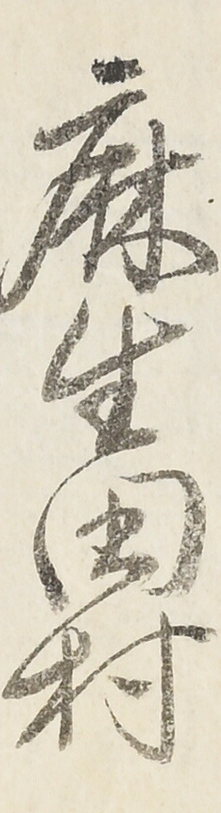麻生田村
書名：中馬御裁許帳面
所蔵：伊那市立高遠町図書館・合同会社AMANE
